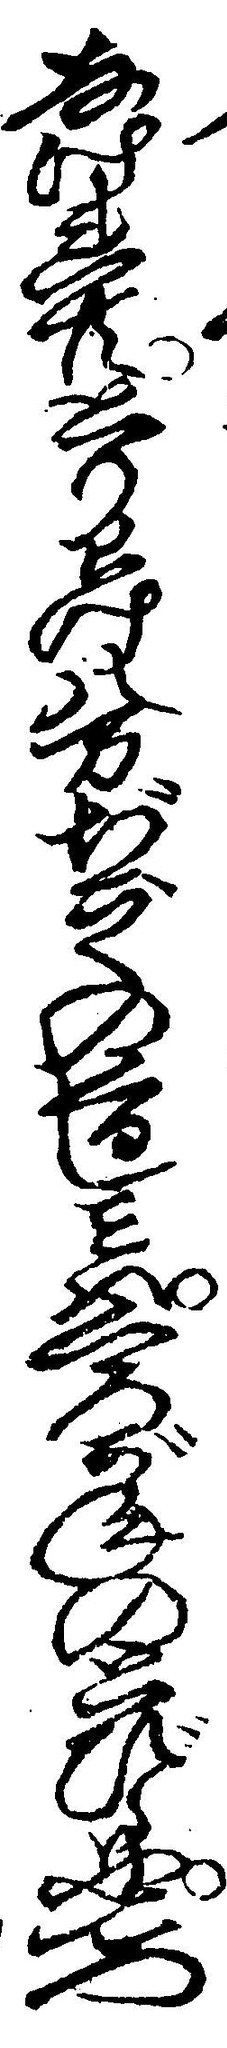なけれ共。とりわけ八万ぢごくのくるしみは。くろがねのとびらに。てつ
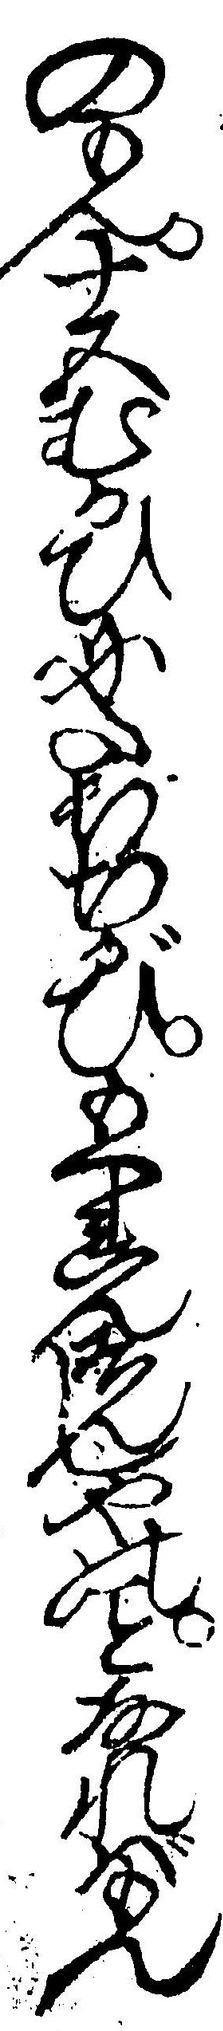のもん。十五むかひにたちちがひ。もくれんそんじやの。ことなればもん
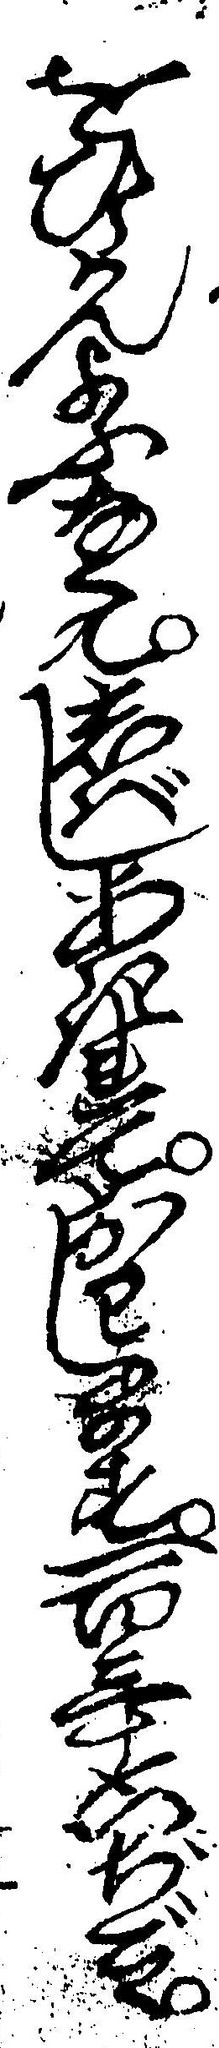をひらかんよふなくて。しばしあきれて。おわします。一百三十六ぢごく。

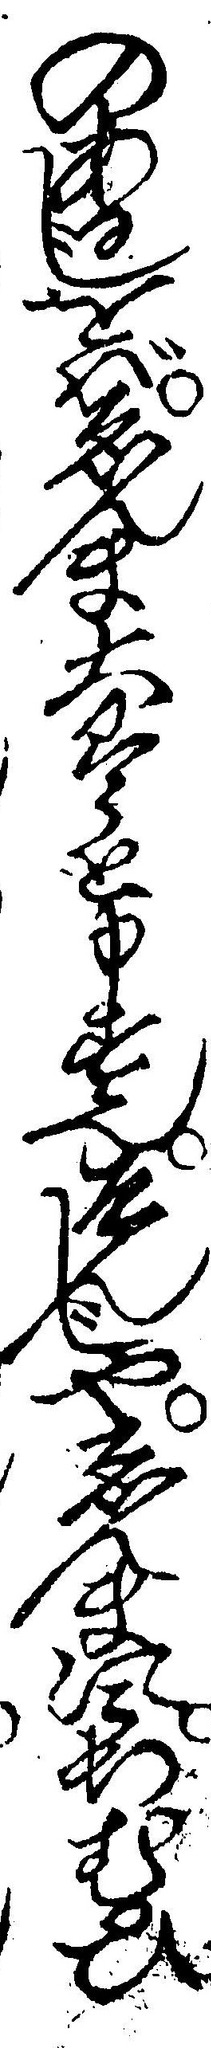のあるじをば。ゑんま大わうと申す也。そんじや。ゑんまに。うちむかひ。
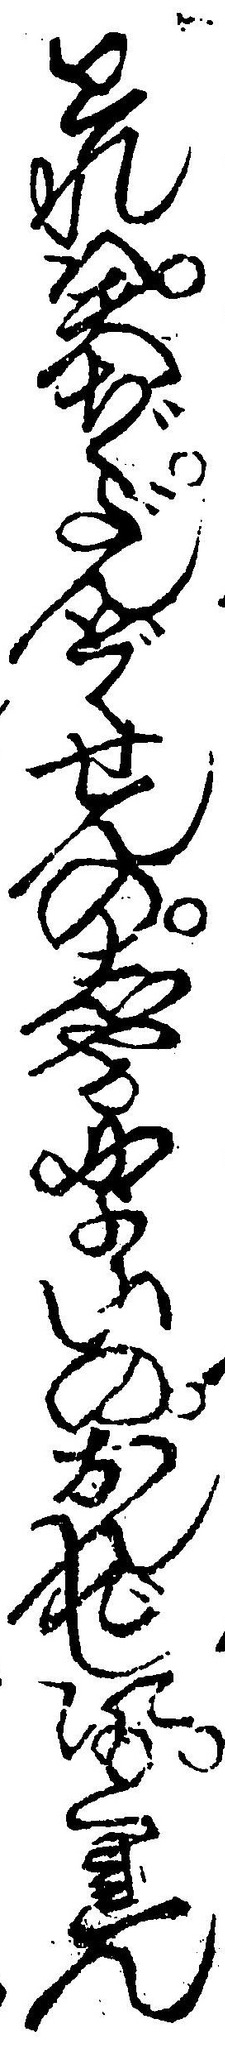われは。天ぢく。だんどくせんの。しやかにょらいの。おんでしに。もくれん
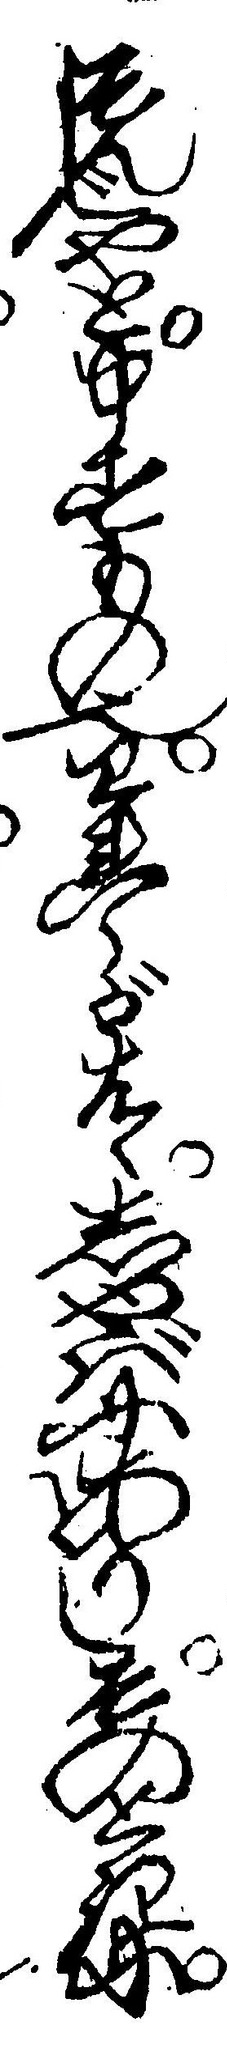そんじやと。申すもの也。われらがはゝ。しやばにありし。そのときに。
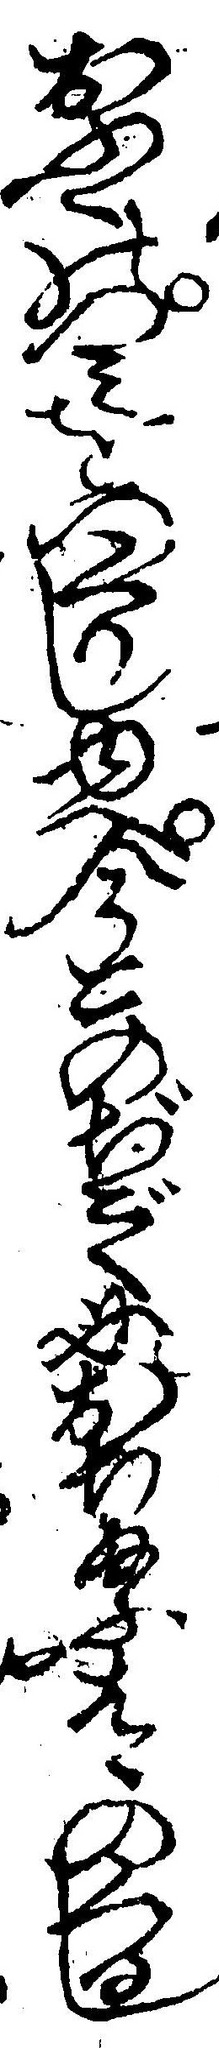おふくの。つみをつくりしゆへ。今このぢごくにおち給ふはゝのくるし
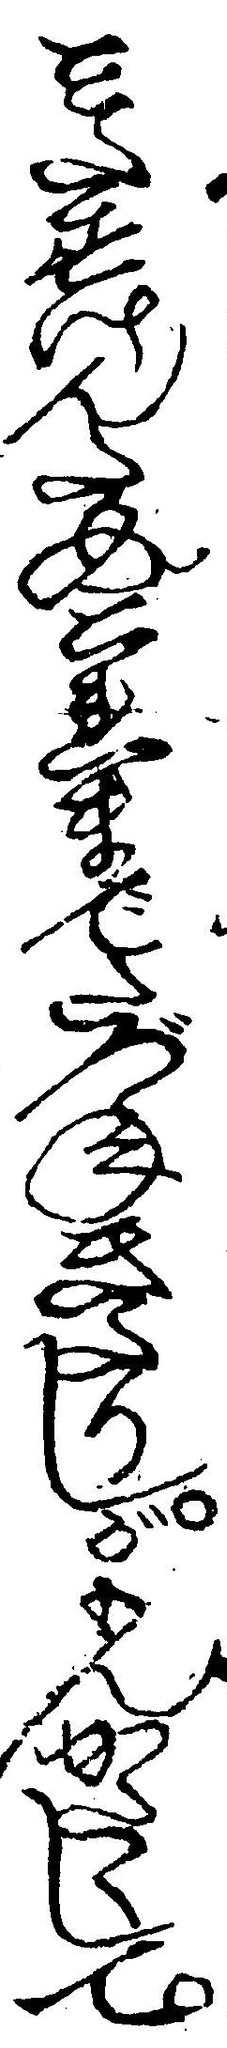みたすけんためこれまでたづねきたりしが。もんかたくして。
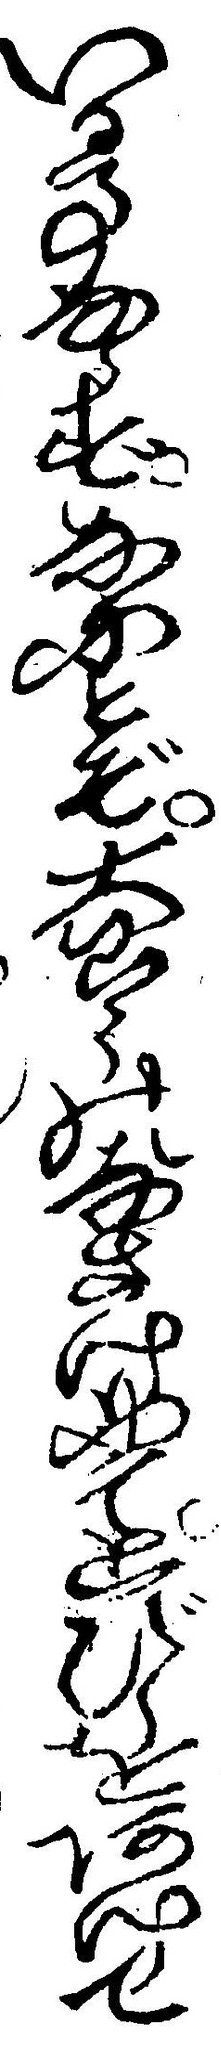いる事ならず。なにとぞ。大わうのなさけにて。とびらをあけて
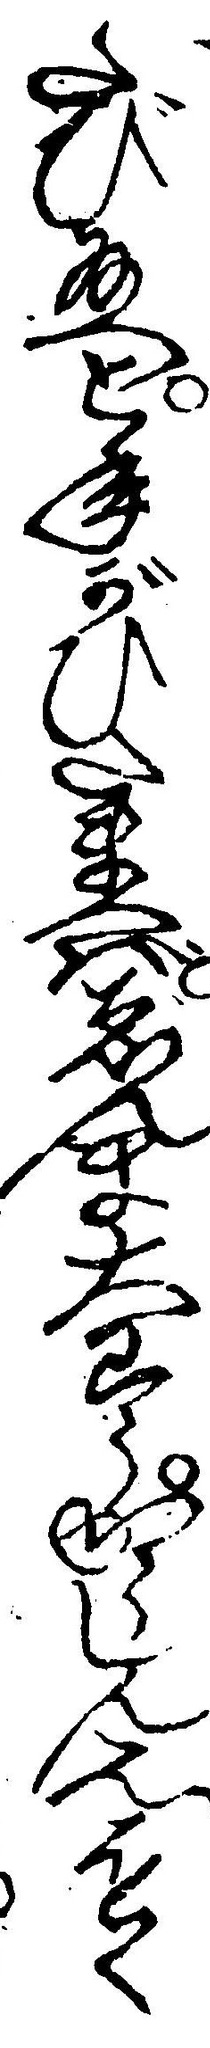たび給へとねがひたまへば。ゑんま大わう。かうしん也もく
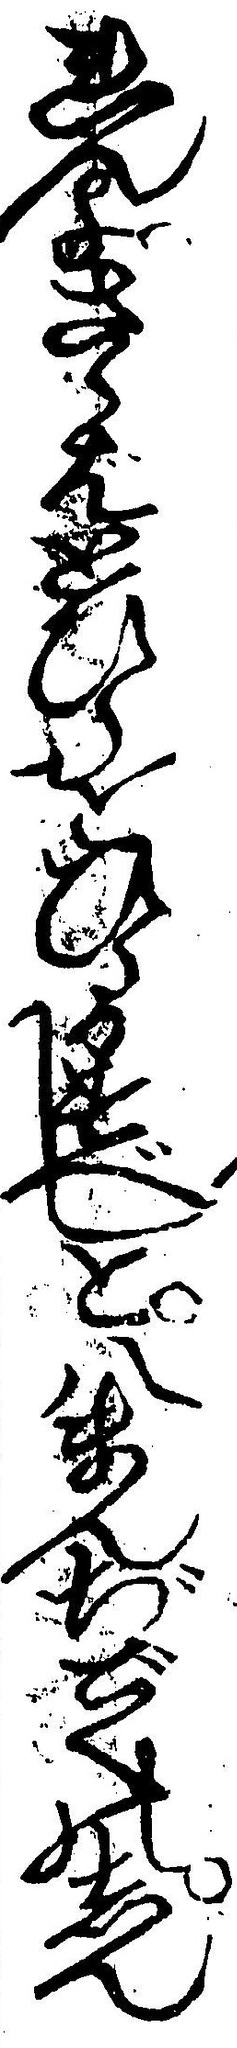れんよさらばとひらをひらかすべしと。八まんぢごくの。しん
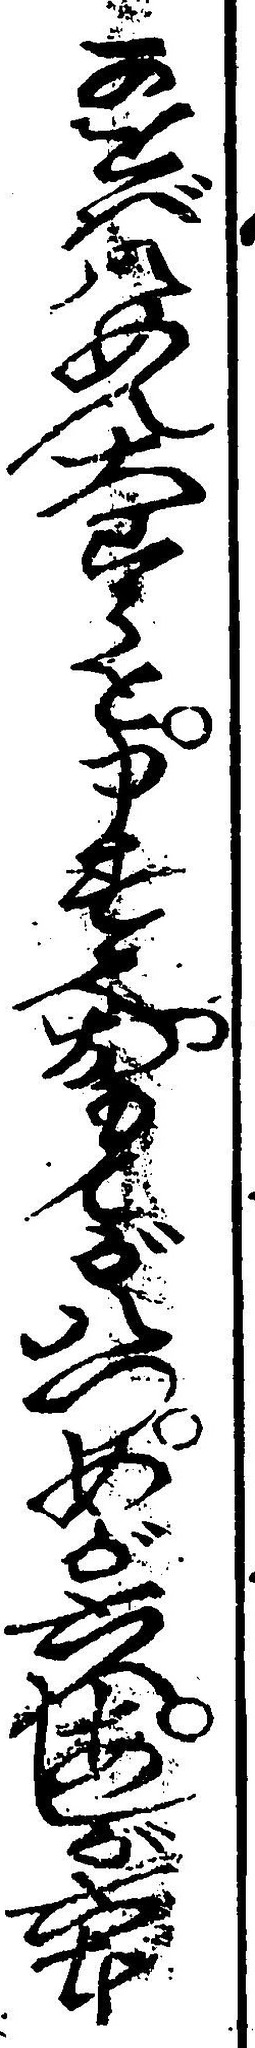かをば八めん大わうと。申す也。おもてが八つ。めが六つ。あしが六本
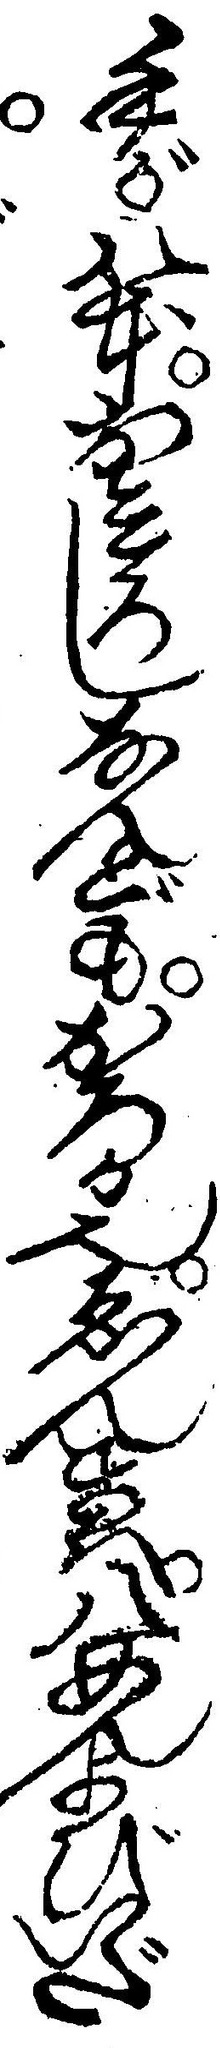手が八本。おそろしなんども。おろか也。ゑんまは。八めんよびいだ
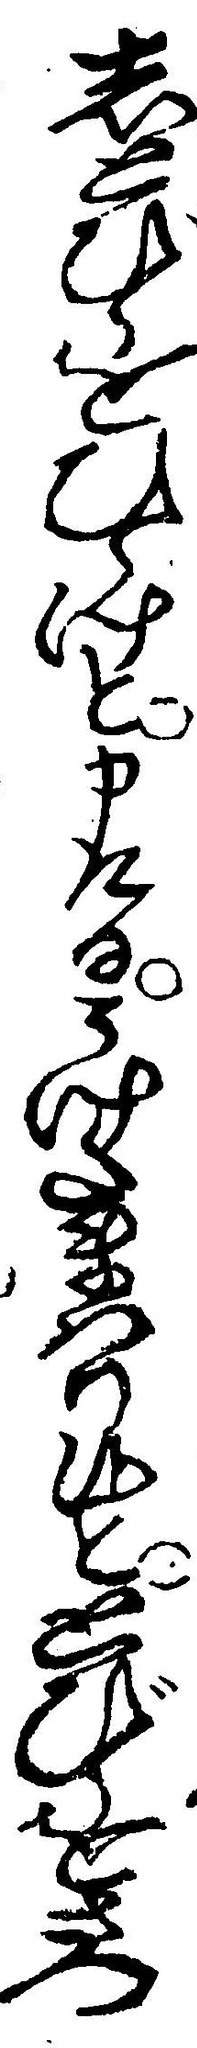し。とびらをひらけと。申ける。うけたまはり候と。とびらをさつ
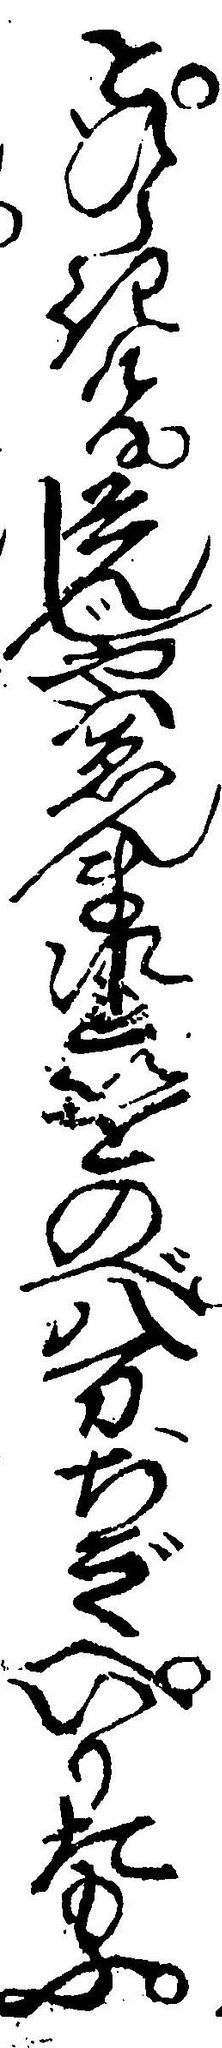と。ひらきける。そんじやはゑんまにれいをのべ。八万ぢごくへ。いりたもふ。
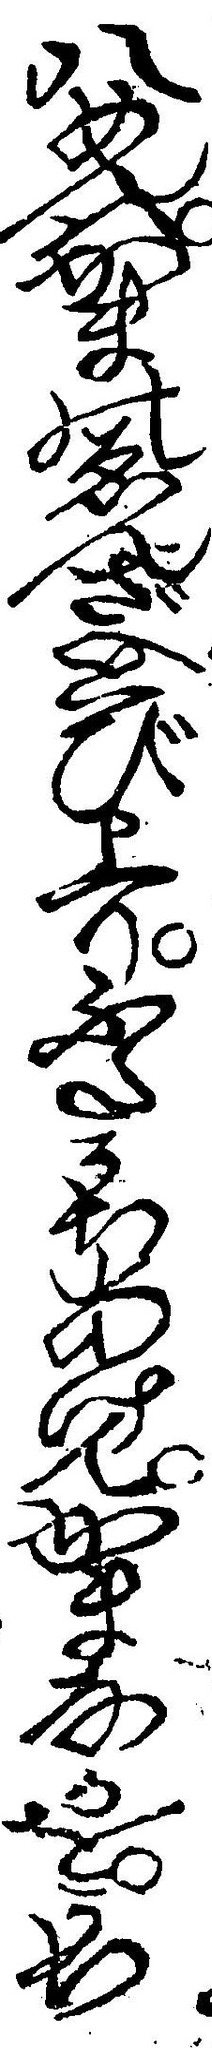八めんは。かまのゑんざへとび上り。ふたうちあけて。かまなかを。うち
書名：目連尊者地獄めくり / 宇留藤太夫正本
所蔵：東京大学総合図書館 General Library in the University of Tokyo, JAPAN
